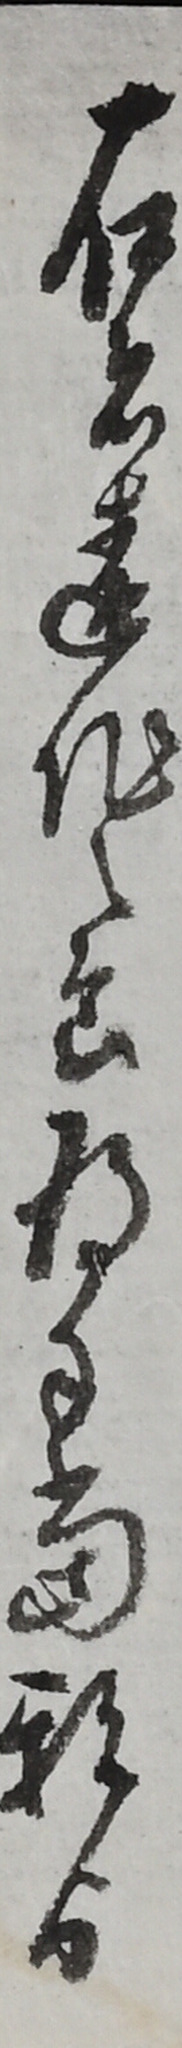右者違作之節為手当邪ゟ
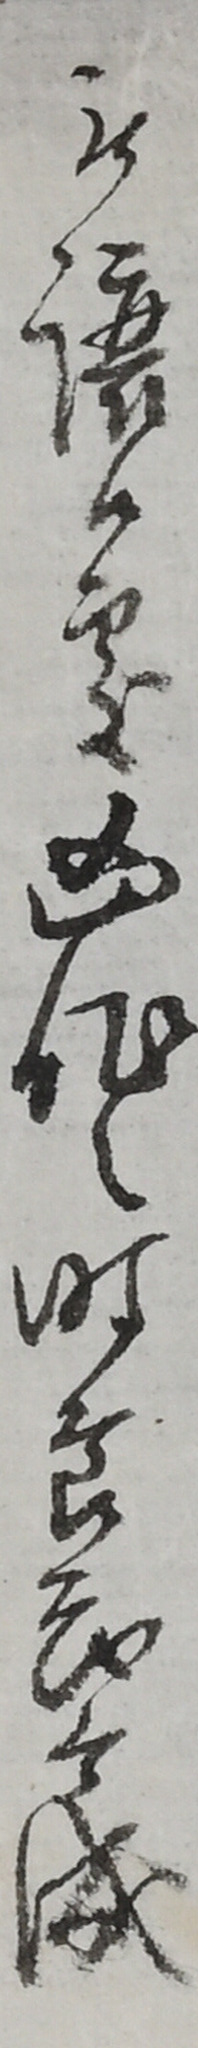被譲候処凶作之時節茂ケ成
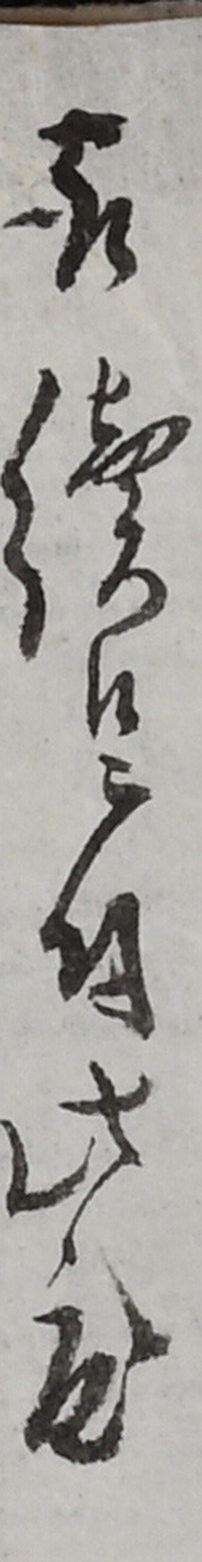取続候ニ付此度
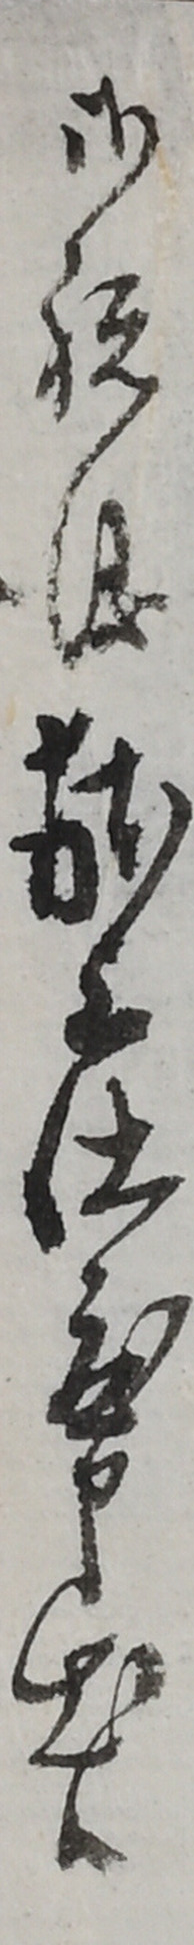御祝儀献上仕度申出候
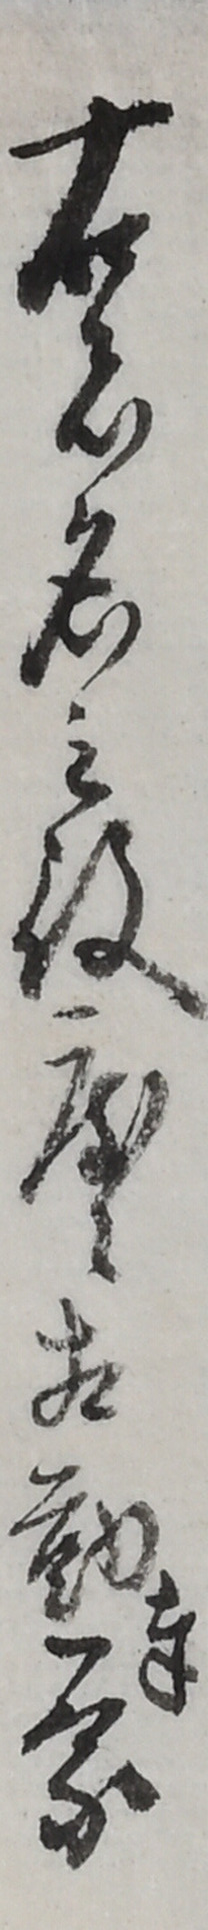右者名主役度々相勤蒙
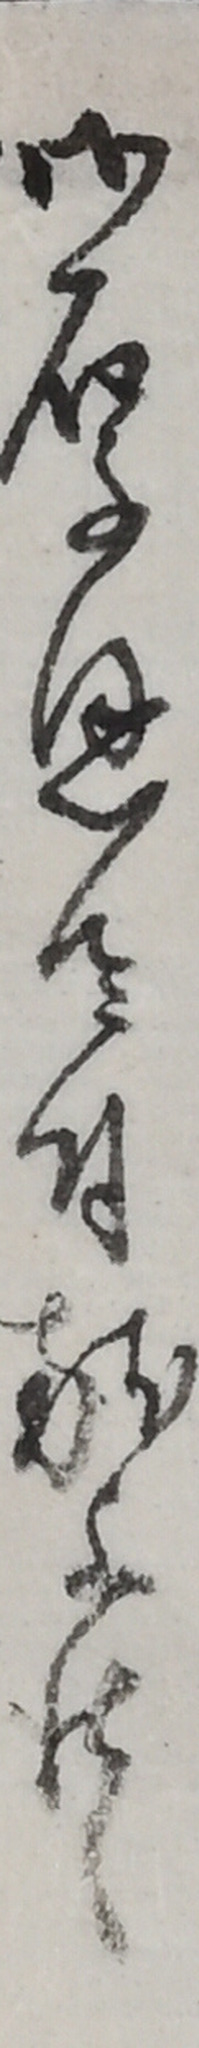御厚恩候ニ付献上仕候
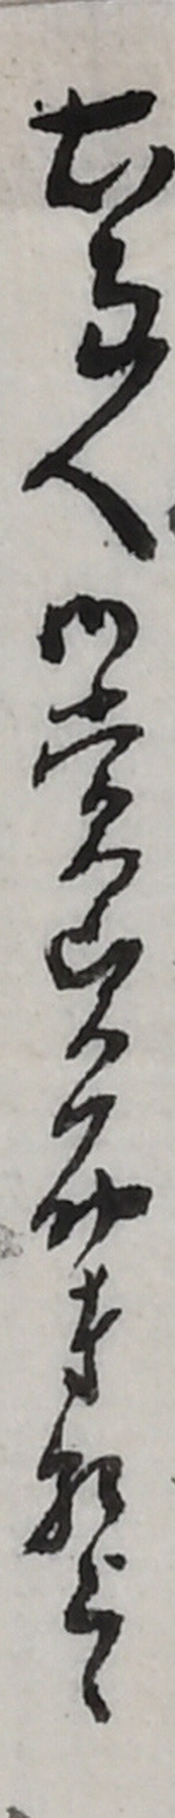右両人御賞美筋奉願上候
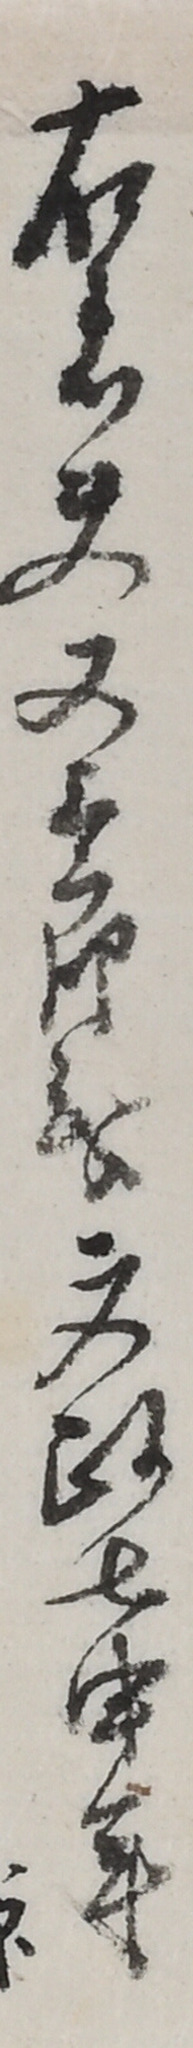右者夫又三郎義文政七申年
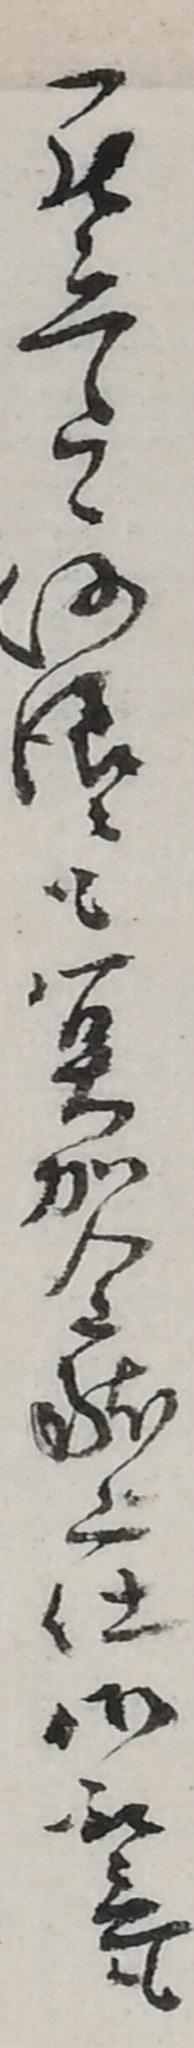罷在候ハゞ何様ニも冥加金献上仕御取立も
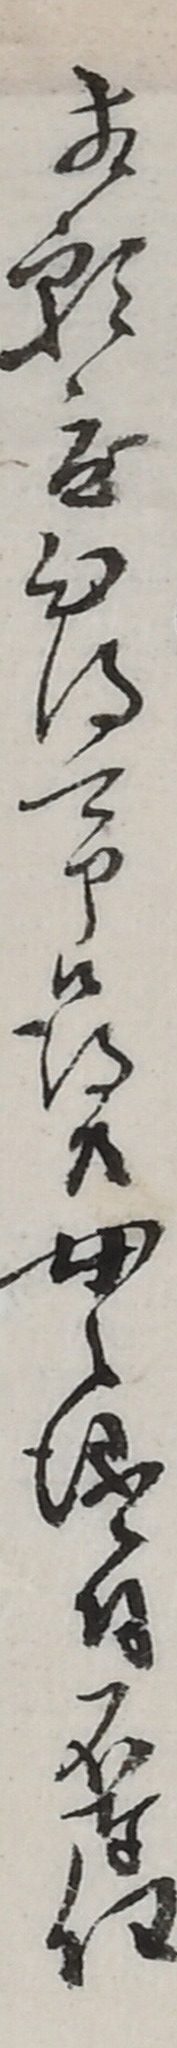相願度心得可申候得共女之儀ニ付不奉任
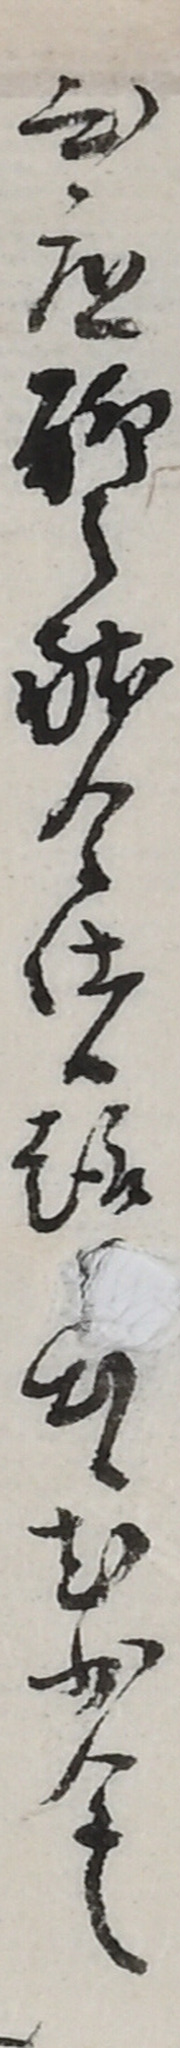心底聊之献金仕候趣申出候尤少金之
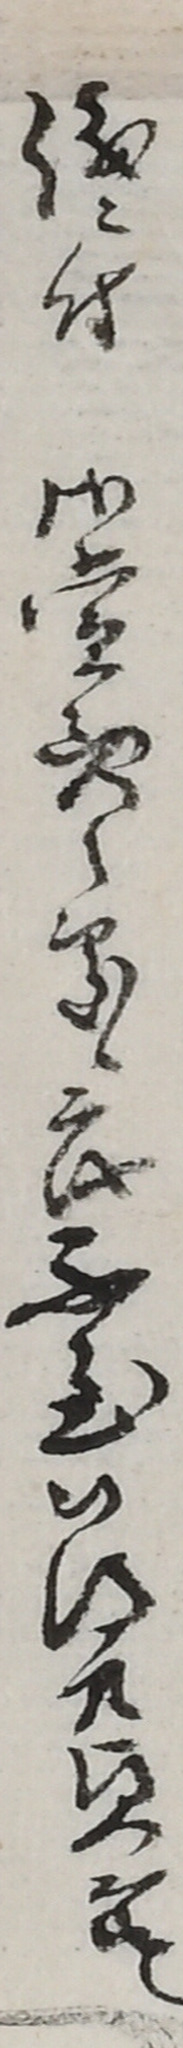儀ニ付御賞美之処候茂不至候得共美節之
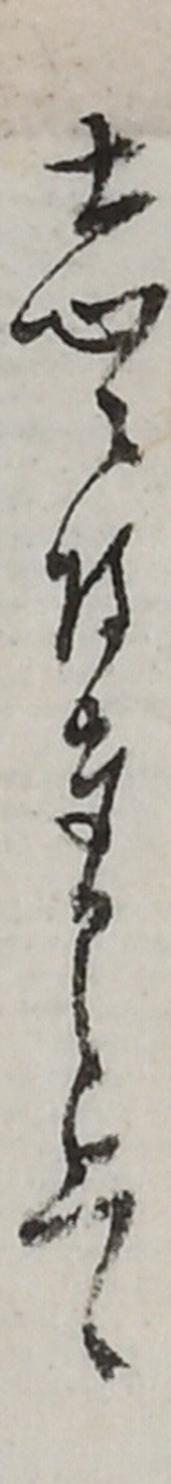志ニ付奉申上候
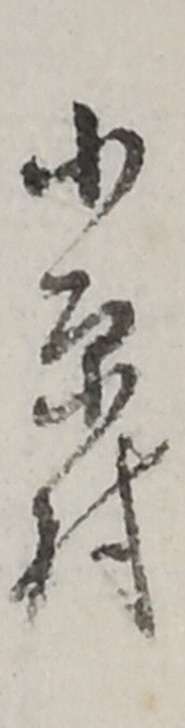小原村
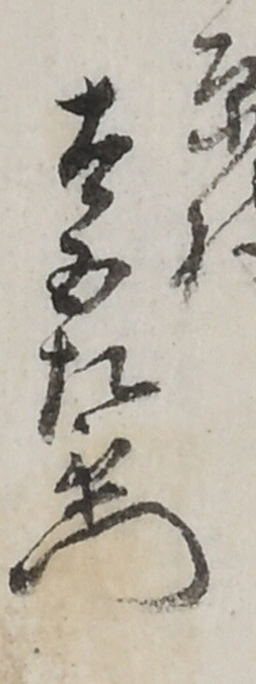太五左衛門
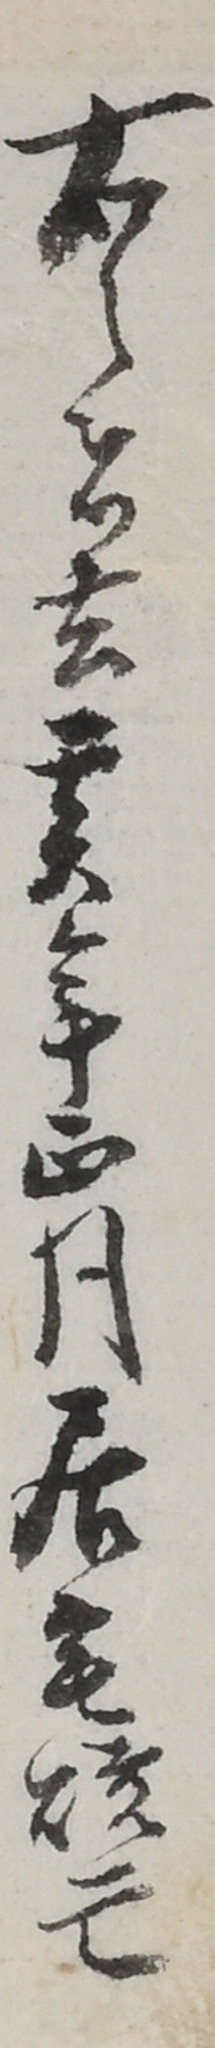右之者玄亥年正月居宅焼亡
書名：百五拾亗（歳）御祝廻村御用手控
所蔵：伊那市立高遠町図書館・合同会社AMANE
